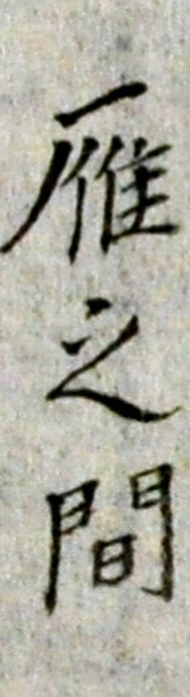雁之間
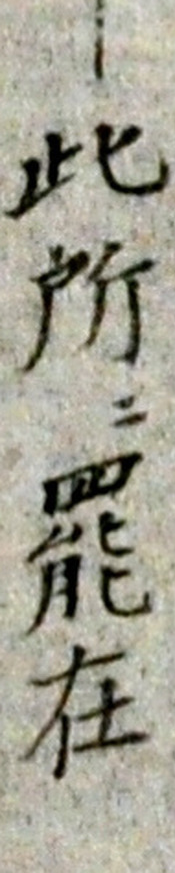此所ニ罷在
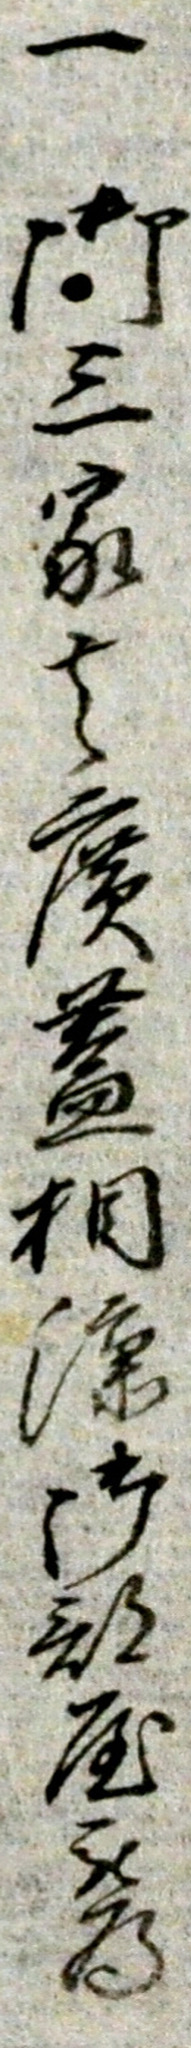一御三家者廣蓋相済御部屋被為
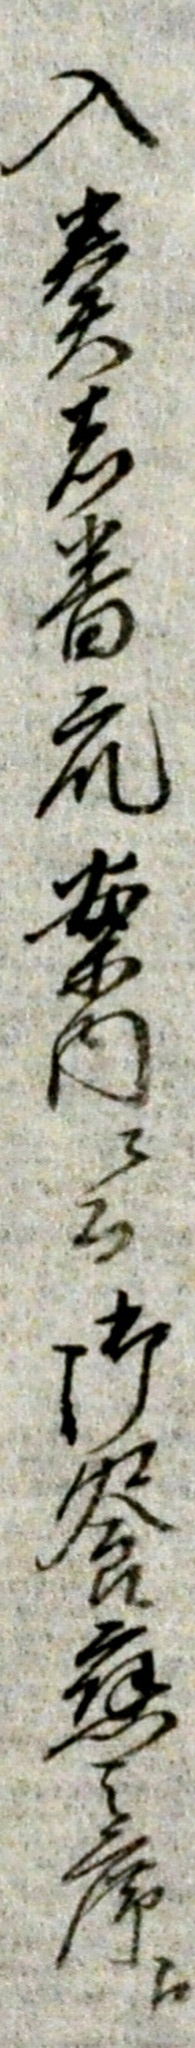入奏者番衆案内ニ而御饗應之席え
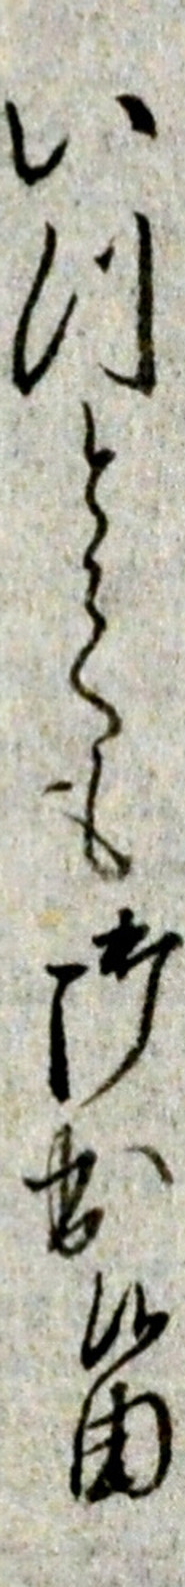いつとても御出候由
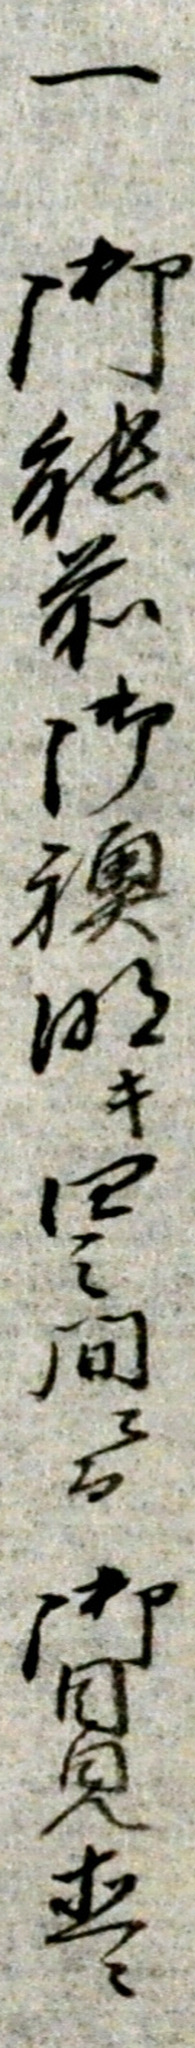一御能前御襖明キ四之間ニ而御目見直ニ
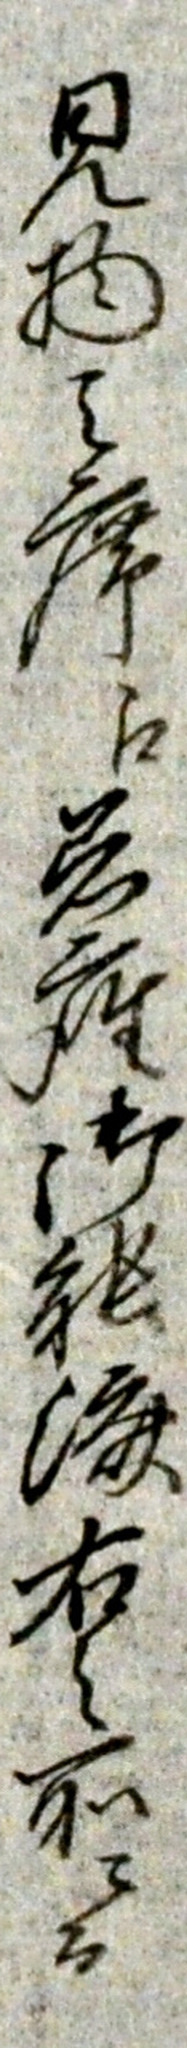見物之席え着座御能済右之所ニ而
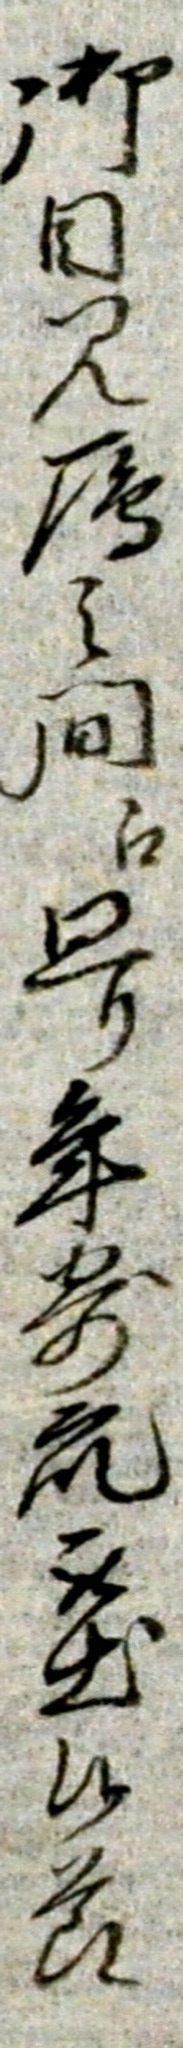御目見雁之間え廻り年寄衆被出候節
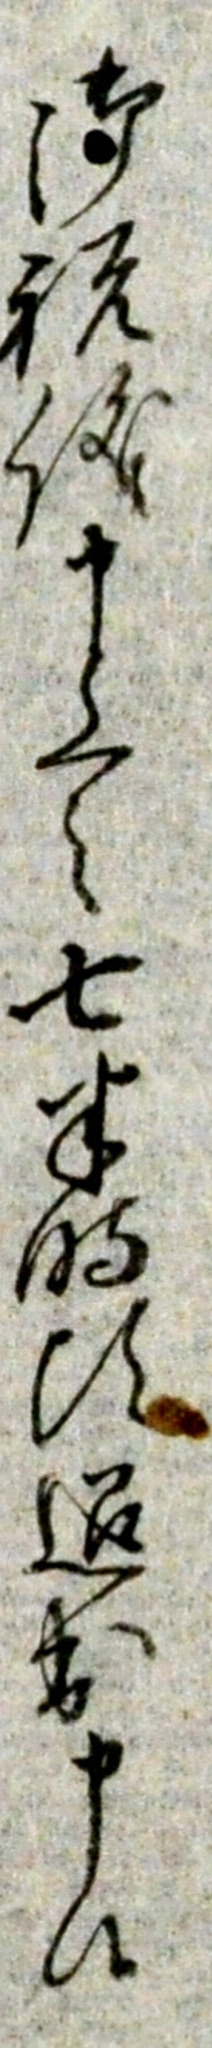御祝儀申上之七半時頃退出申候
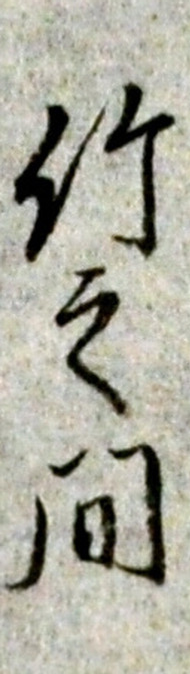雁之間

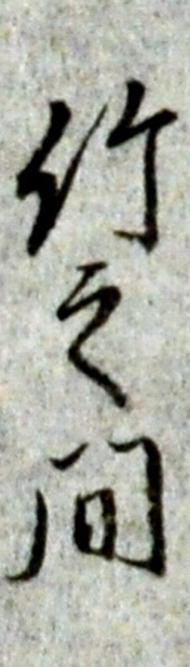竹之間
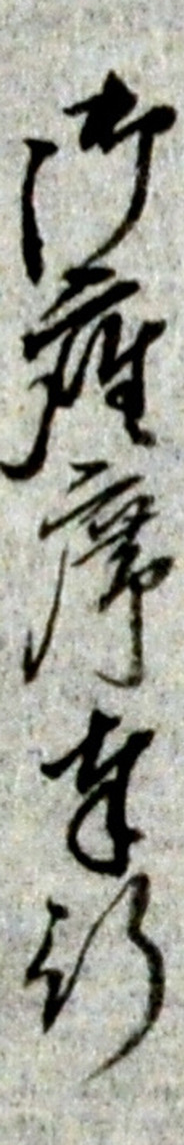御座席奉行
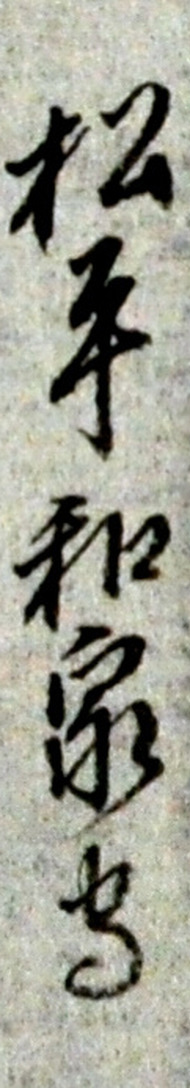松平和泉守
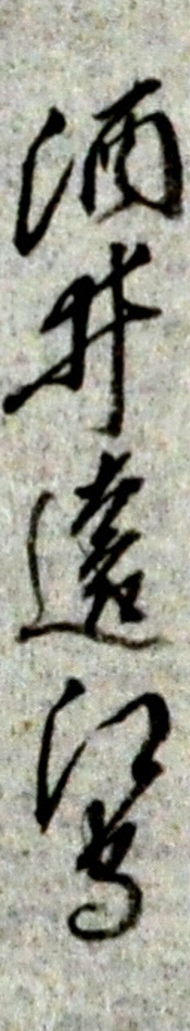酒井遠江守
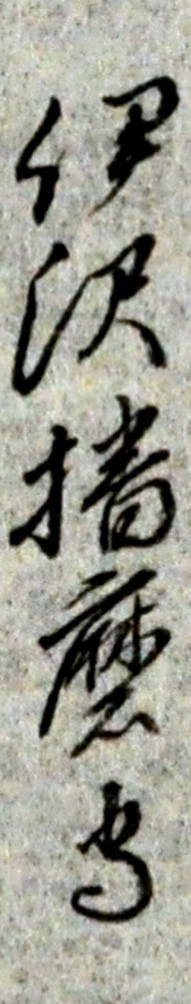伊沢播磨守
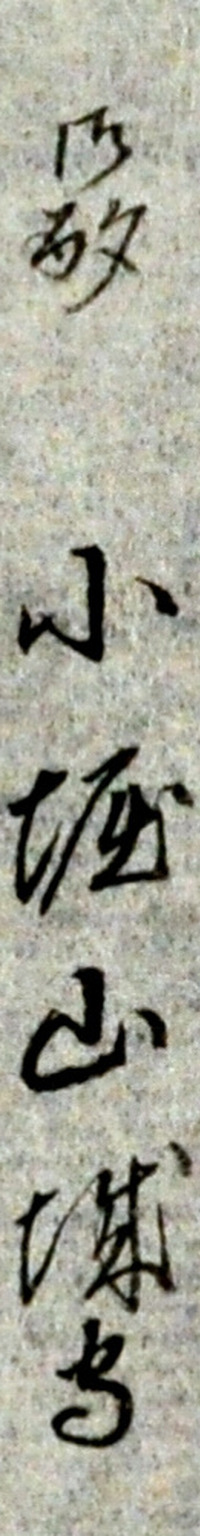御酌小堀山城守
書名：竹ノ間御座席奉行勤方控外
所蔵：伊那市立高遠町図書館・合同会社AMANE
